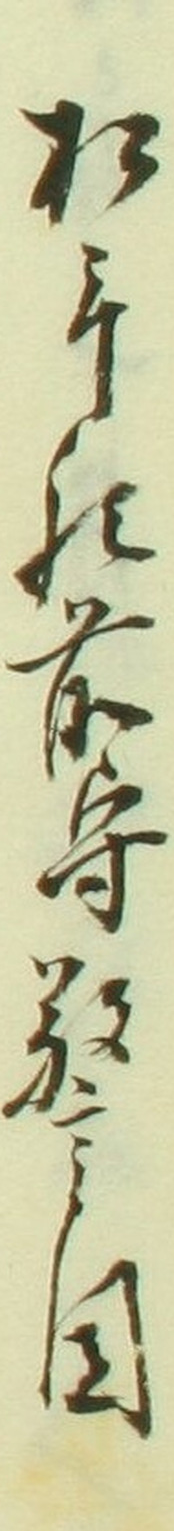松平肥前守警固
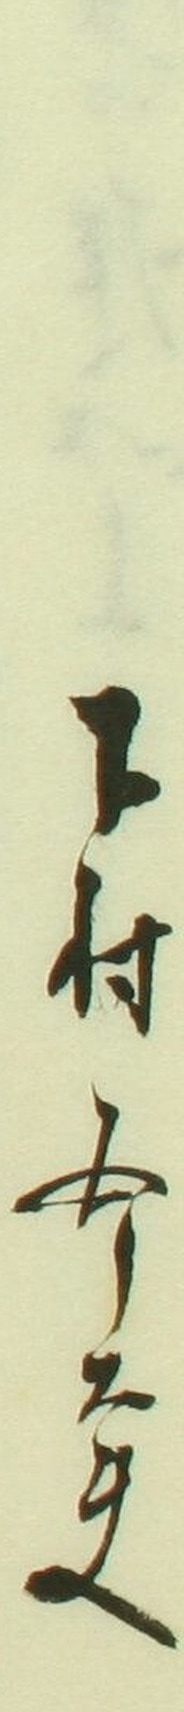下村五郎太夫
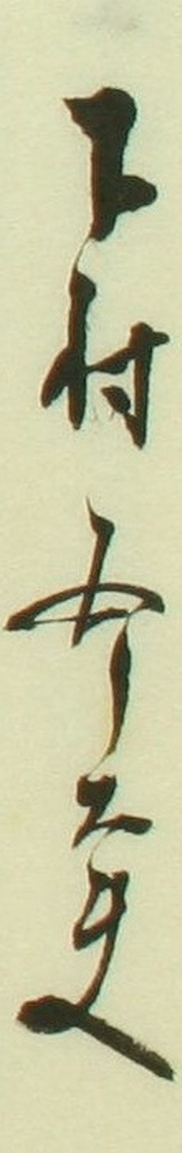下村五郎太夫
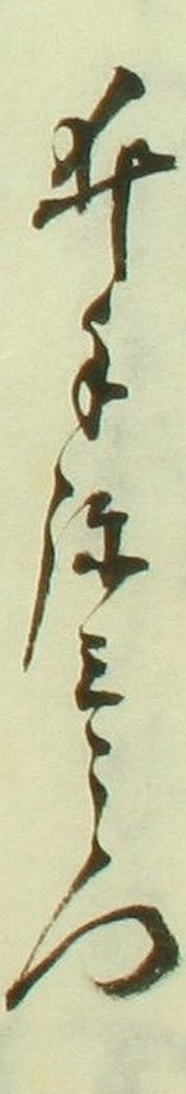井手弥三右衛門
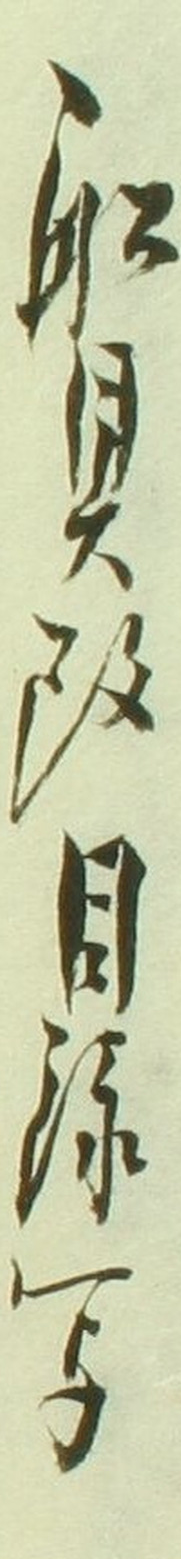船具改目録写
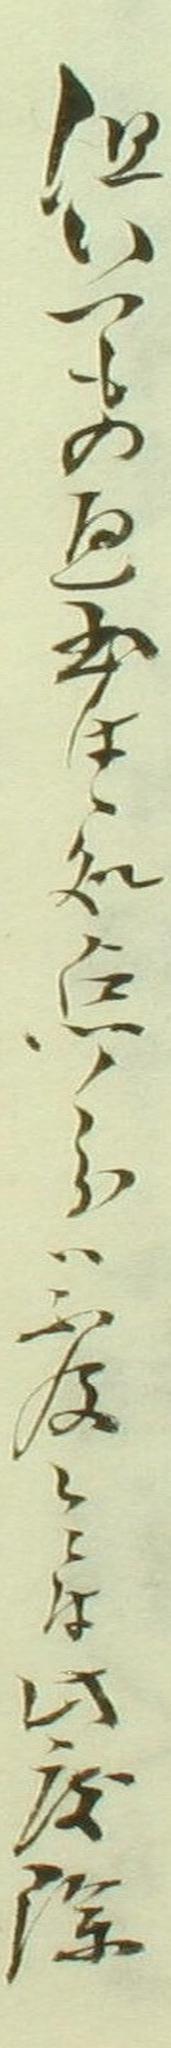但いつもの通書付候処点ノ分ハ不及候ニ付此度除
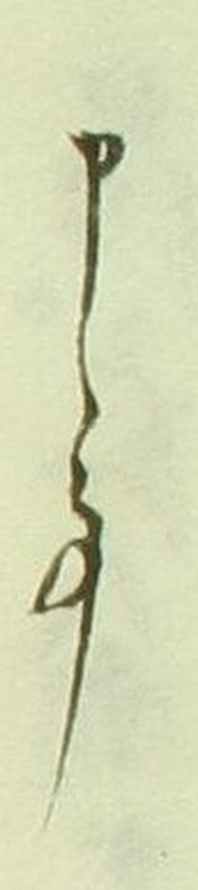申候事
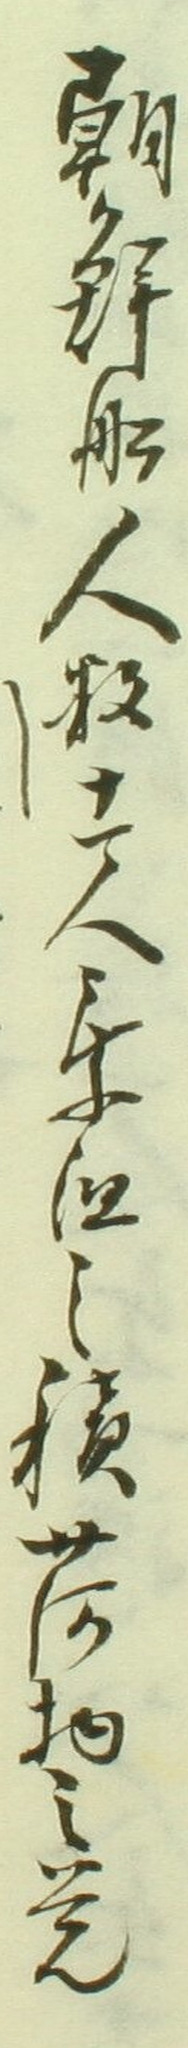朝鮮船人数十一人乗組之積荷物之覚
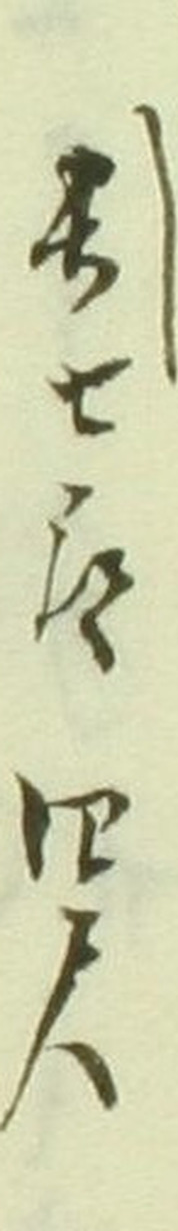長七尋四尺
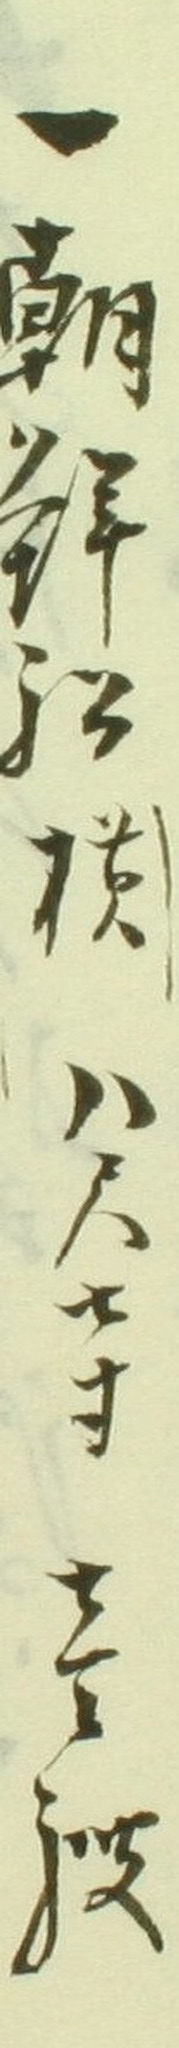一朝鮮船横八尺七寸壱艘
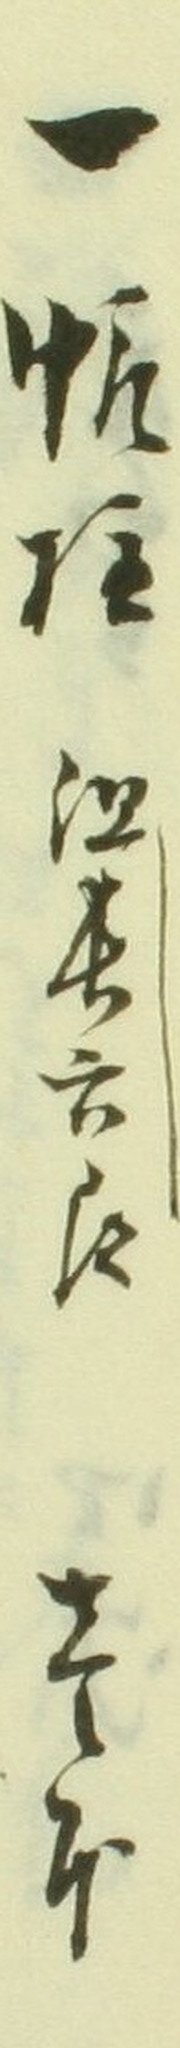一帆柱但長六尋壱本
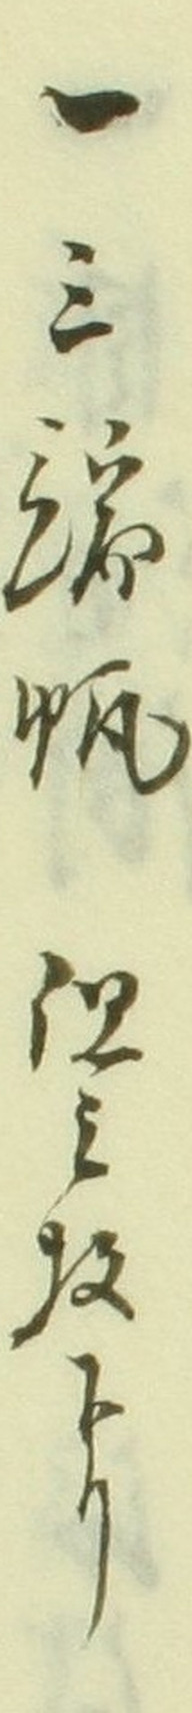一三端帆但三枚下り
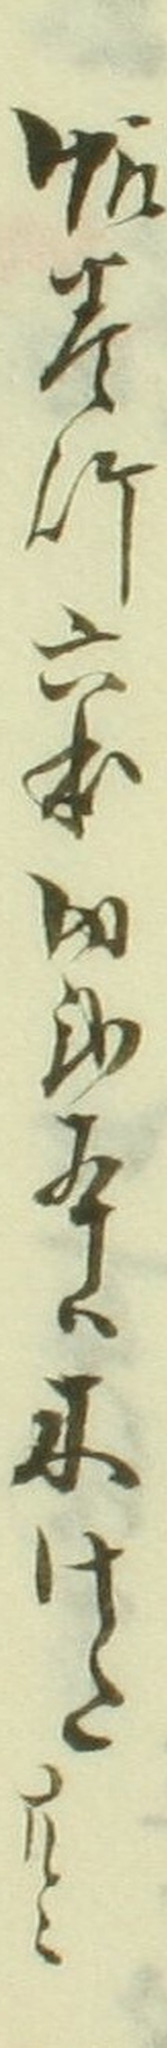帆巻竹六本内弐本ハ木けた共ニ
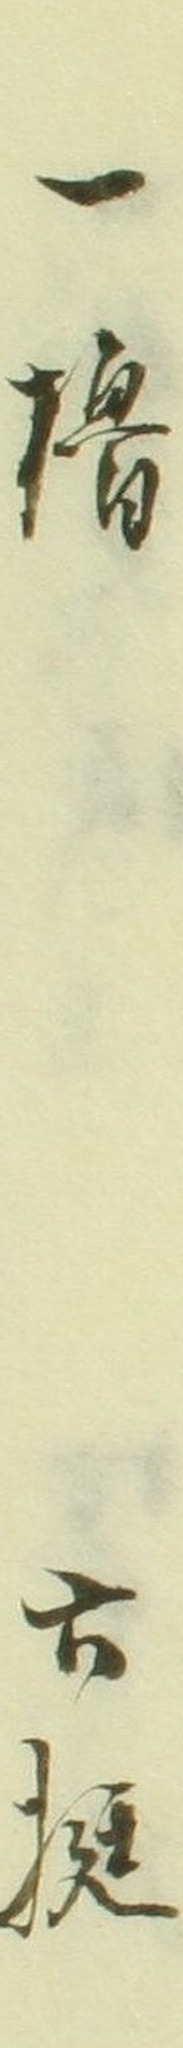一櫓六挺
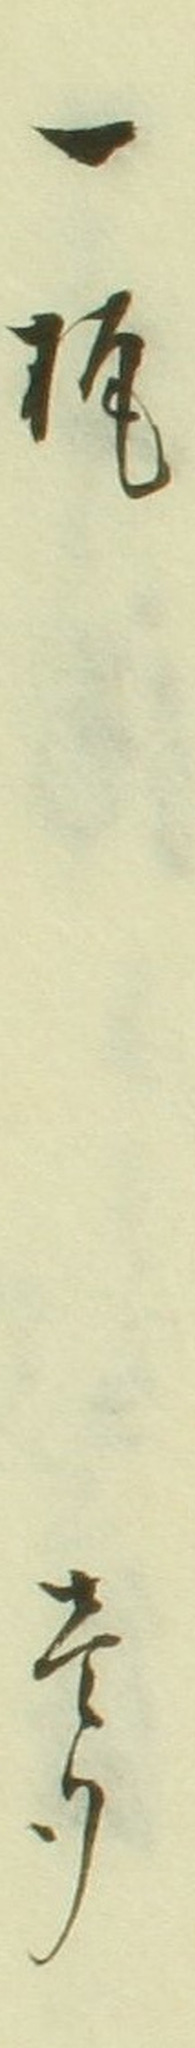一楫壱ツ
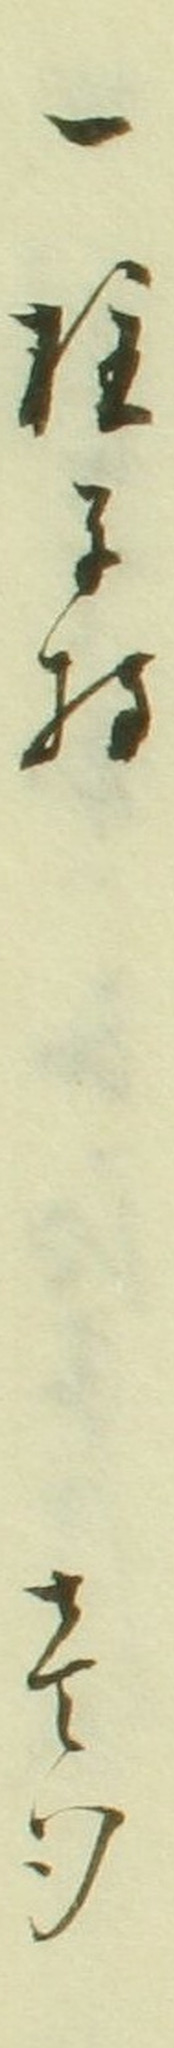一柱子持壱ツ
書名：異国船漂着記
